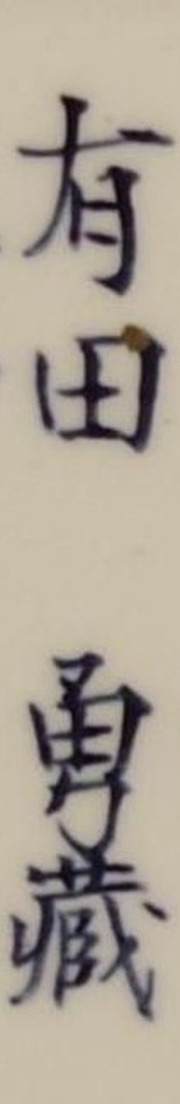有田勇蔵
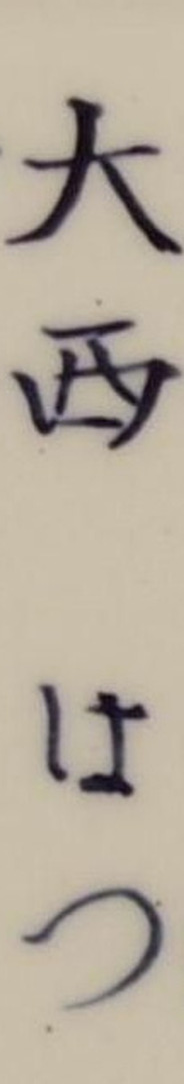大西はつ
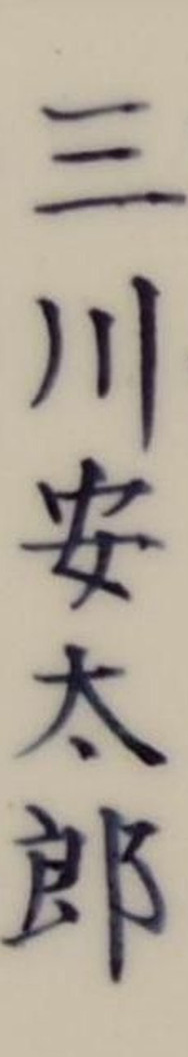三川安太郎
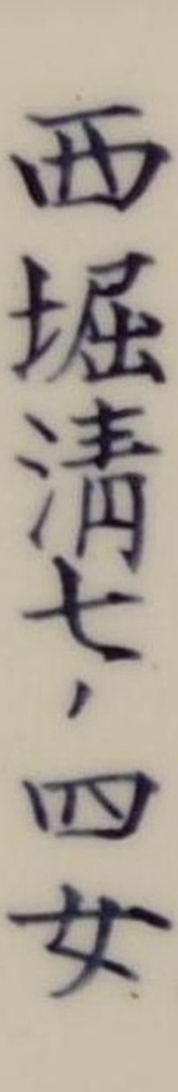西堀清七ノ四女
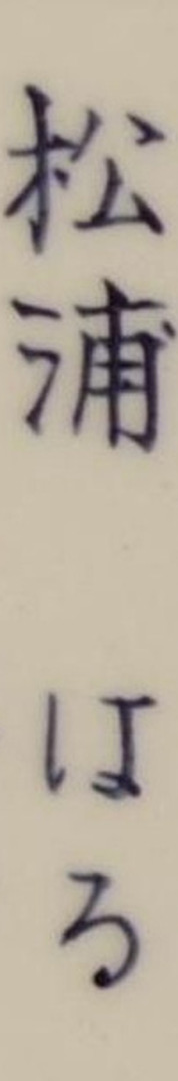松浦はる
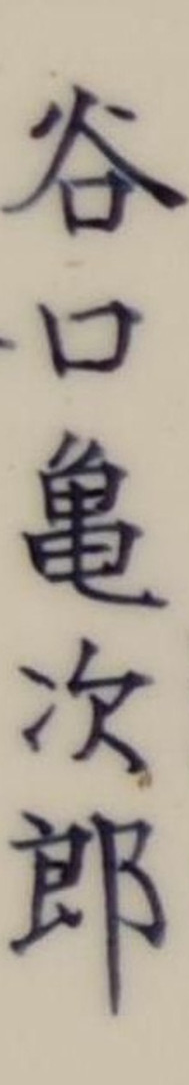谷口亀次郎
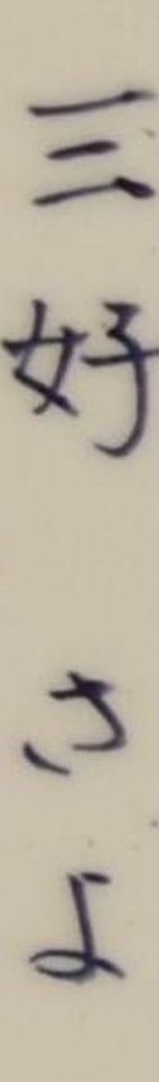三好さよ
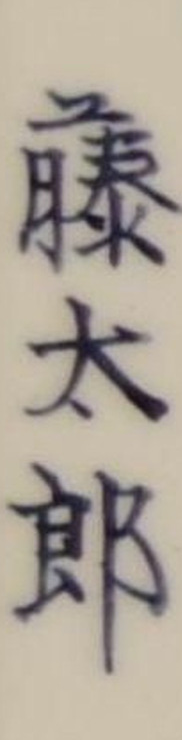藤太郎

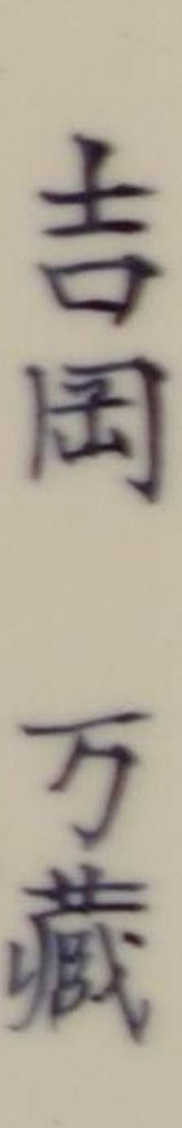吉岡万蔵
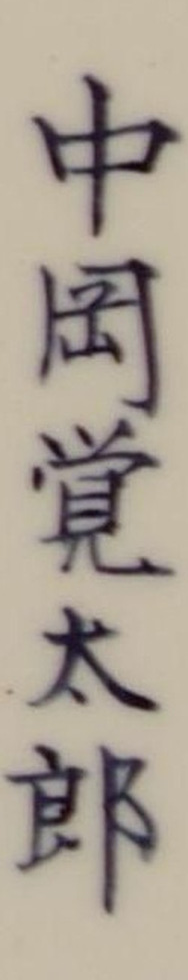中岡覚太郎
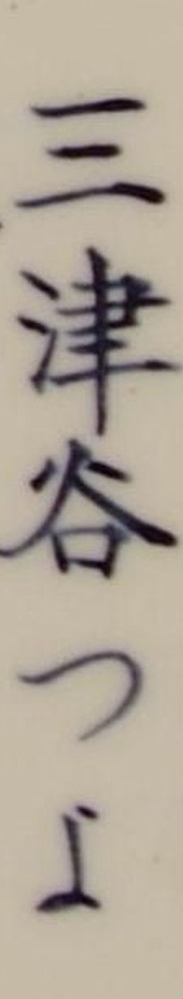三津谷つよ
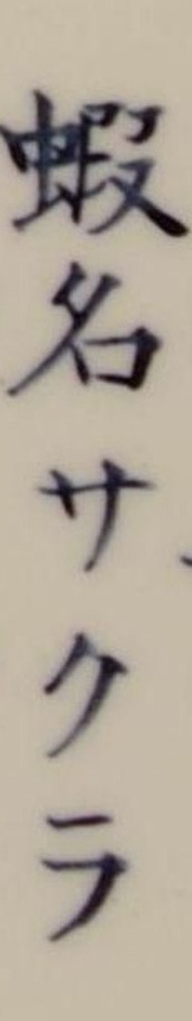蝦名サクラ
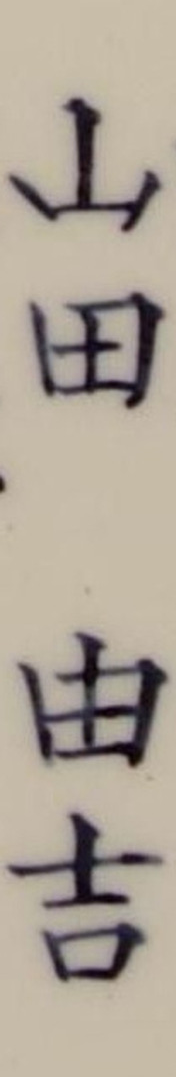山田由吉
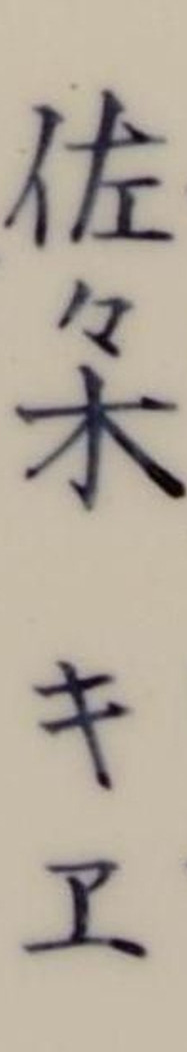佐々木キヱ
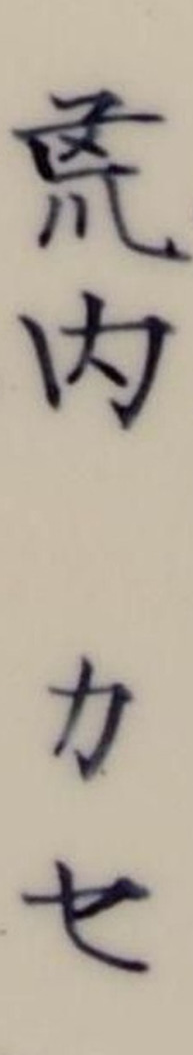荒内カセ
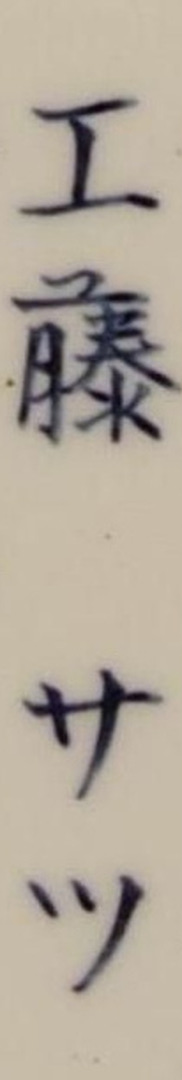工藤サツ
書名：M~S
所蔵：高野山金剛峯寺
